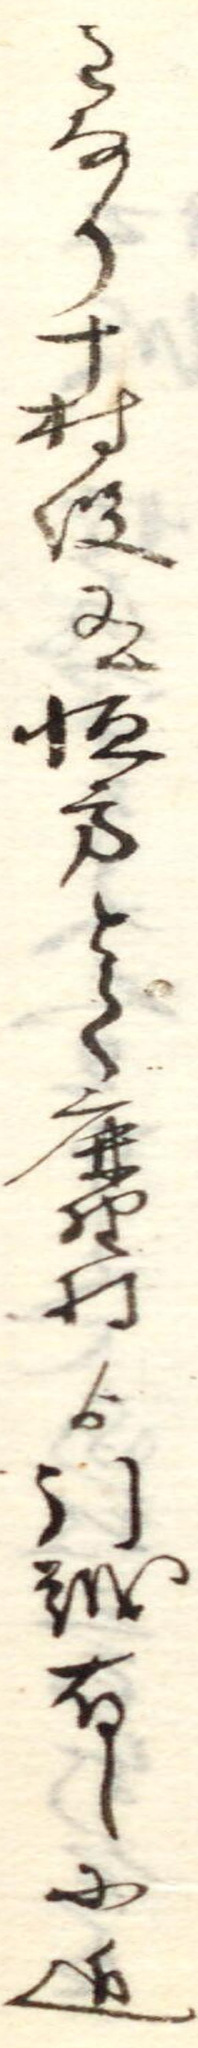主なり十村役有恒方とて鹿野村ゟ引越有しに近
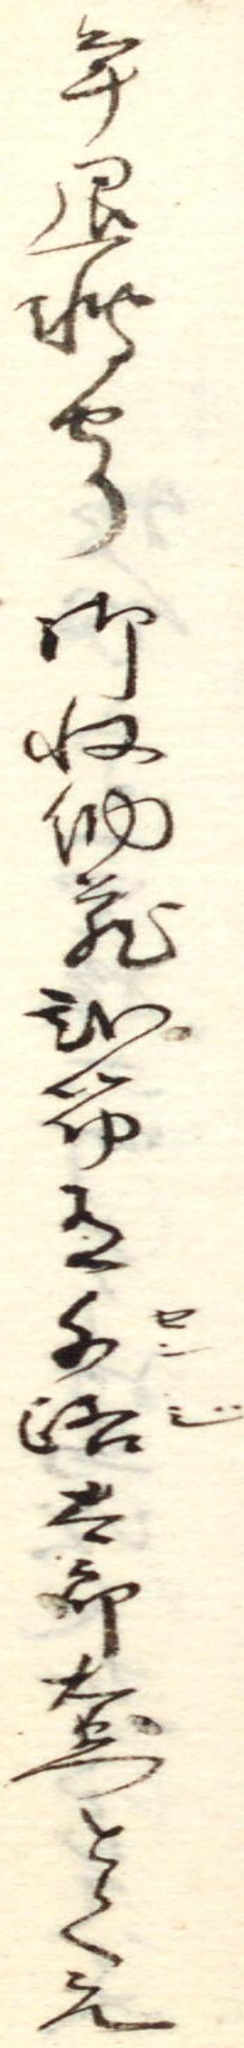年退転せり御収納蔵弐筋有千路太郎右衛門とて元
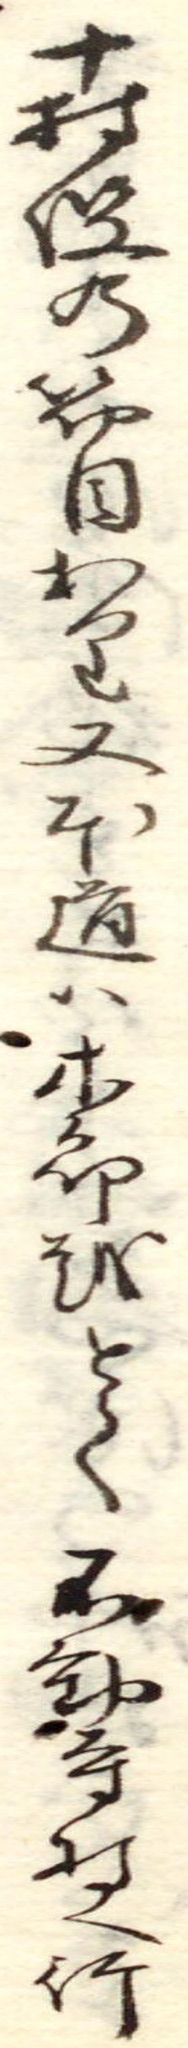十村役の筋目あり又本道は木郎越とて不動寺村へ行
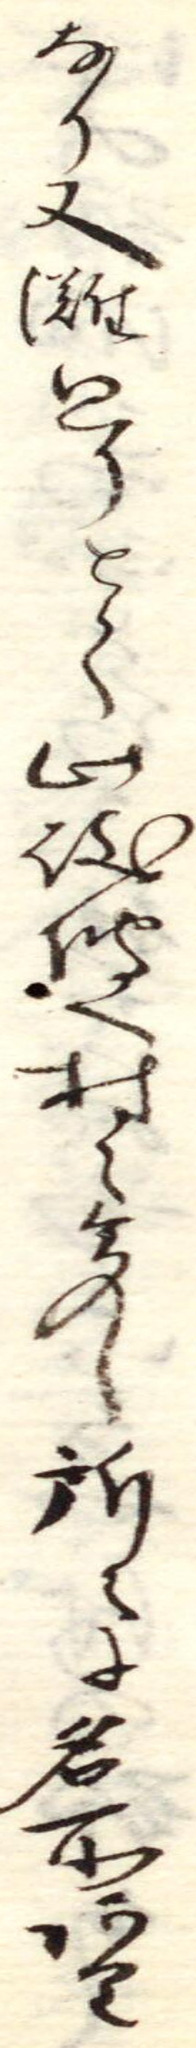なり又灘廻りとて此儀伝へ村々多く所々に名所あり
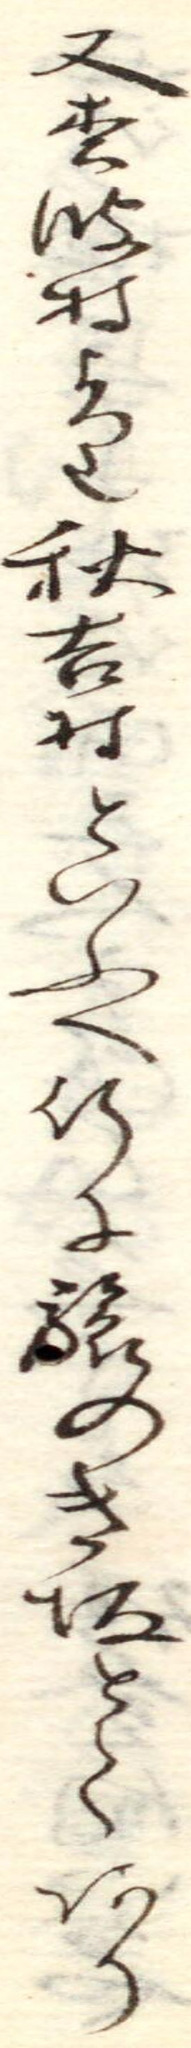又枩波村より秋吉村といふへ行に旅のき坂とてあり
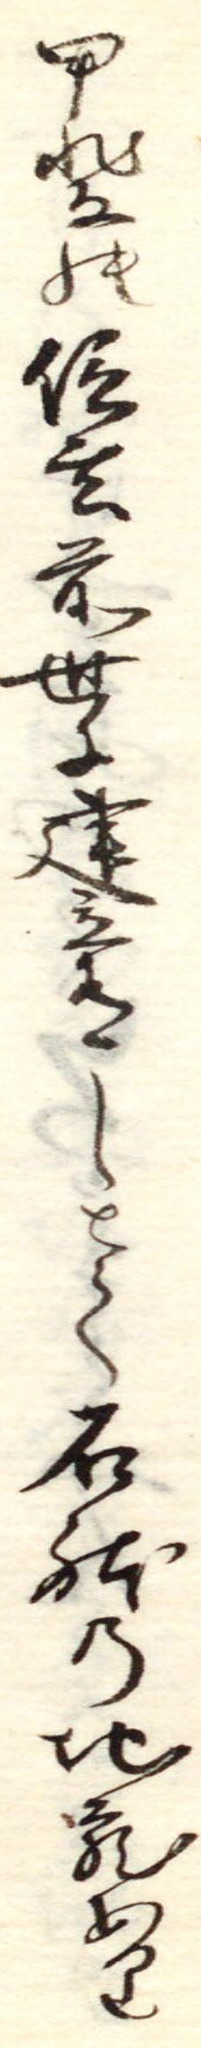甲斐の信玄前世に建立有しとて石躰の地蔵あり
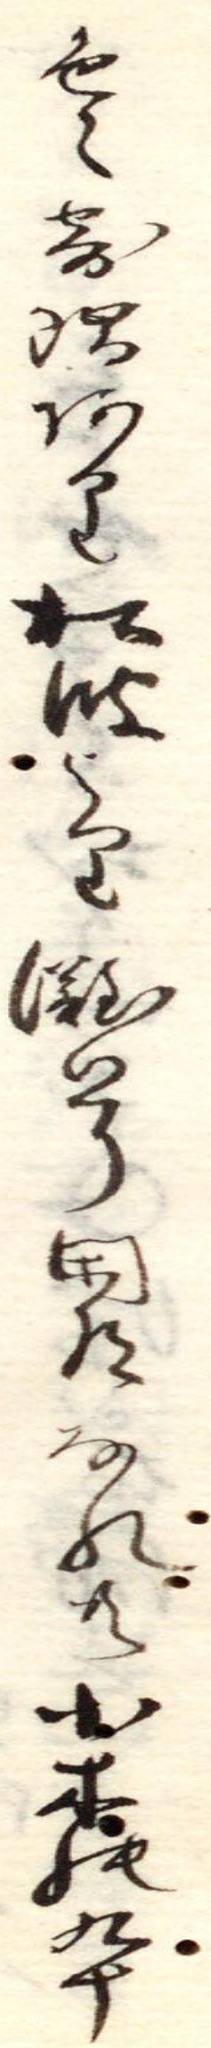色々奇瑞松波より灘廻り閑道なれ共小木の九十
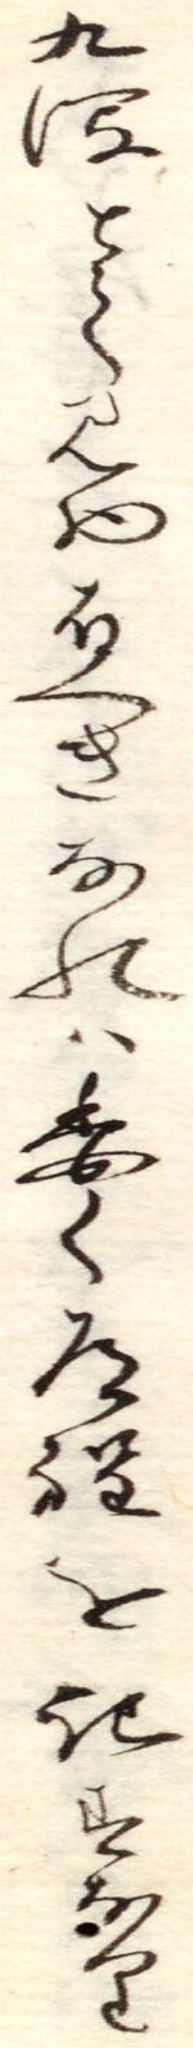九潟とて見物有へきなれは委く道程を記すなり
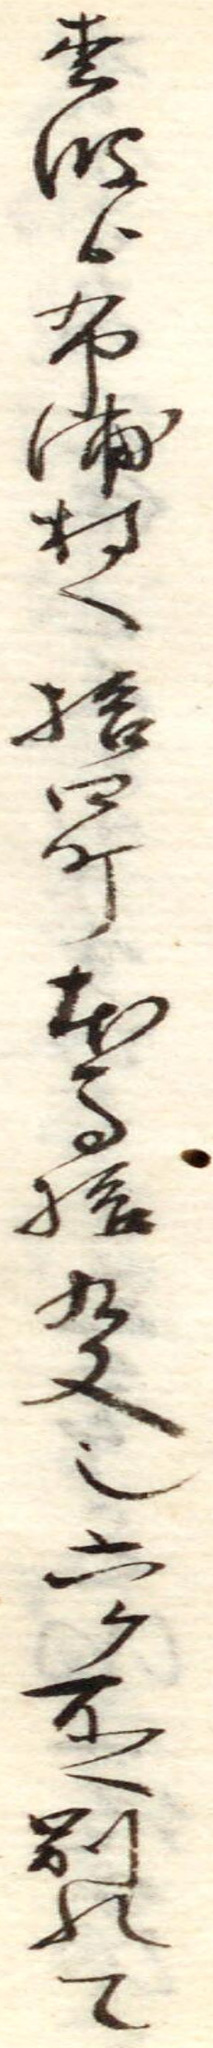枩波ゟ布浦村へ拾四町本馬拾九文也六ヶ所へ別れて
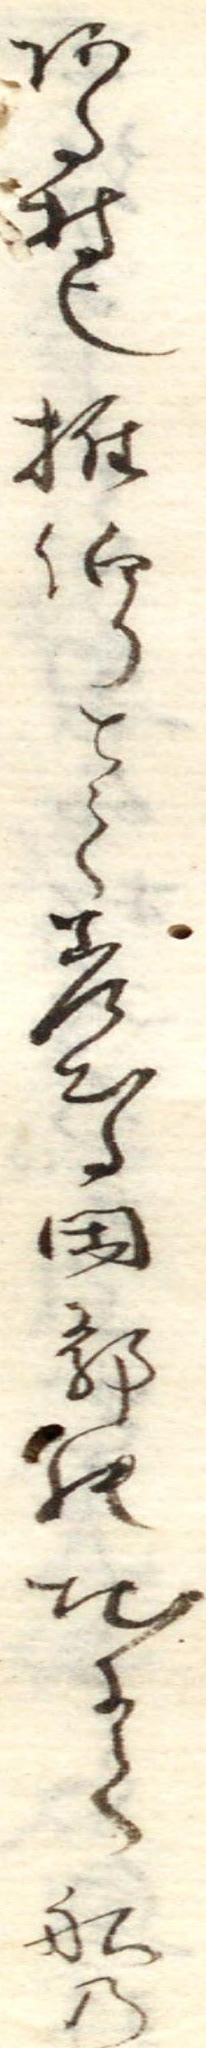ある村也椎泊りとて差出る閑静の地にて舩の
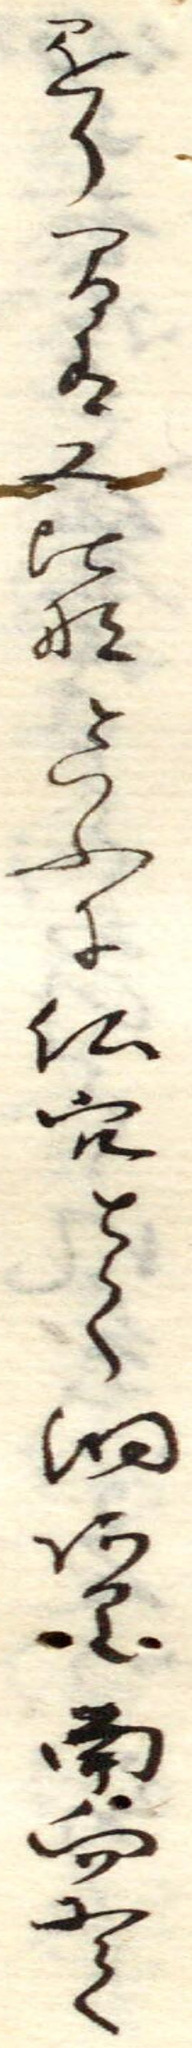懸り間有又ひなといふに仏穴とて洞あり南向にて

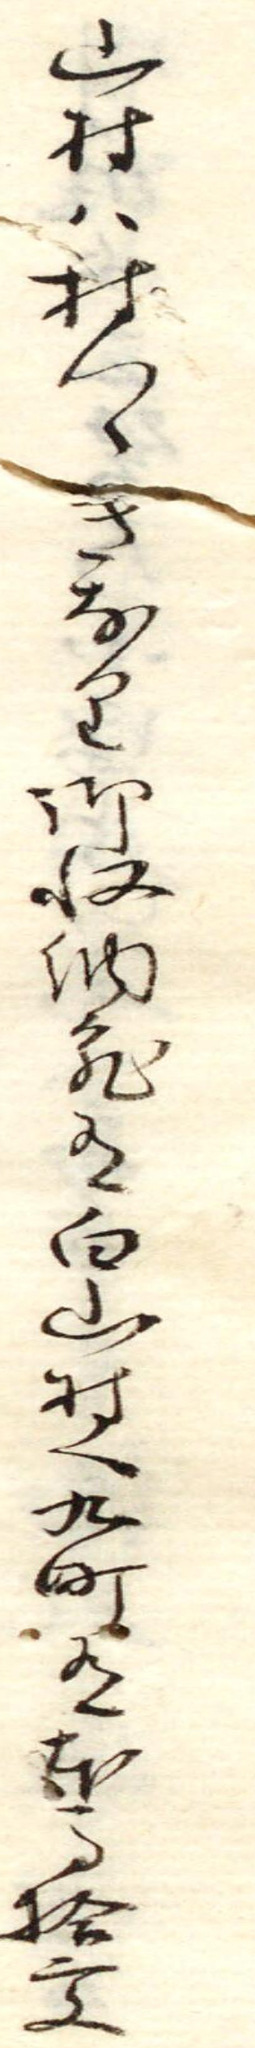山村は村つゝきなり御収納蔵有白山村へ九町有本馬拾二文
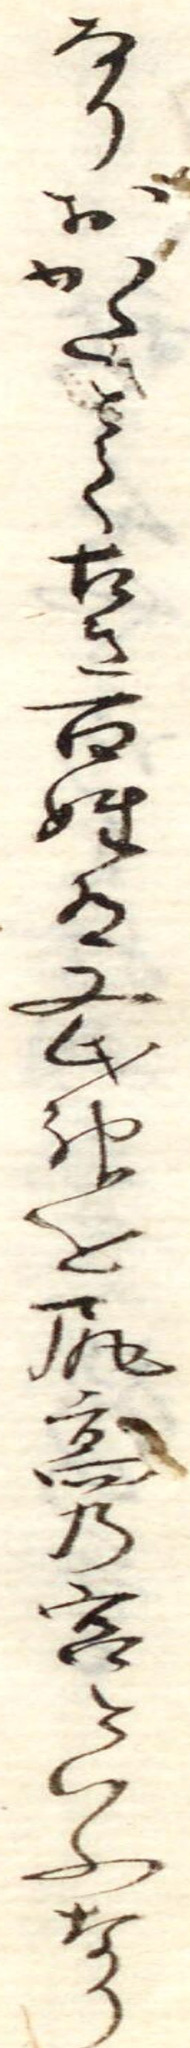なりおかたとて古き百姓有又氏神を尻高の宮といふなり
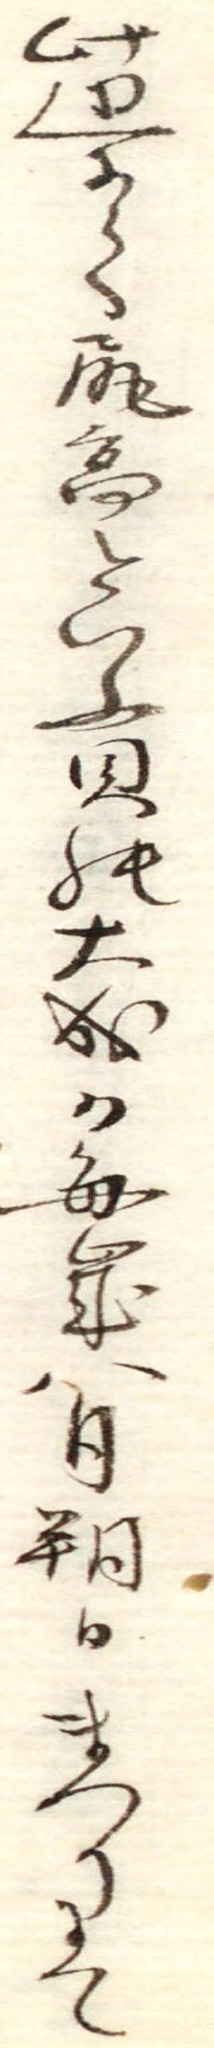此辺にて尻高といふ貝の大成か毎年八月朔日まつりにて
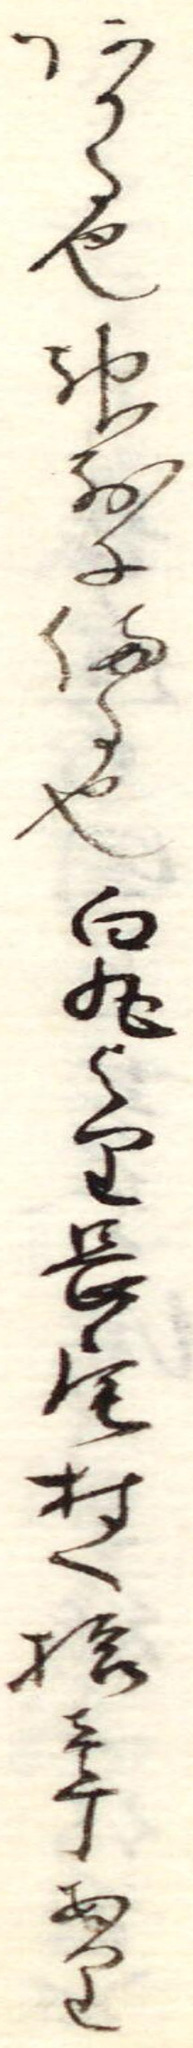あかる也神前に備る也白丸より長尾村へ拾壱丁あり
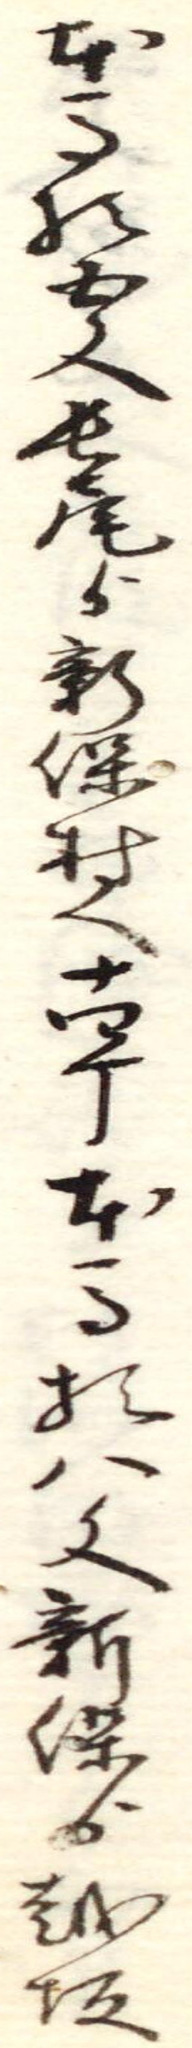本馬拾五文長尾ゟ新保村へ十四丁本馬拾八文新保ゟ越後
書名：能登名跡誌
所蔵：Ishikawa Prefectural Library
